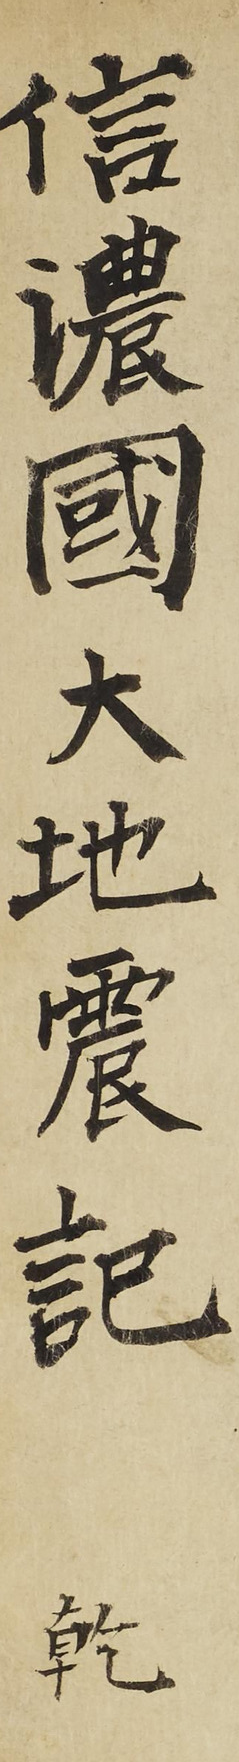信濃国大地震記乾

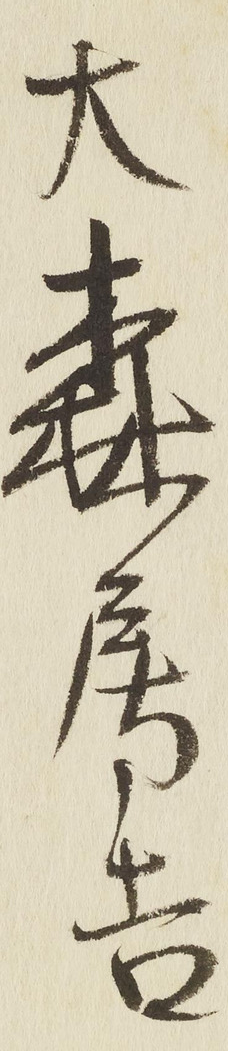大森房吉
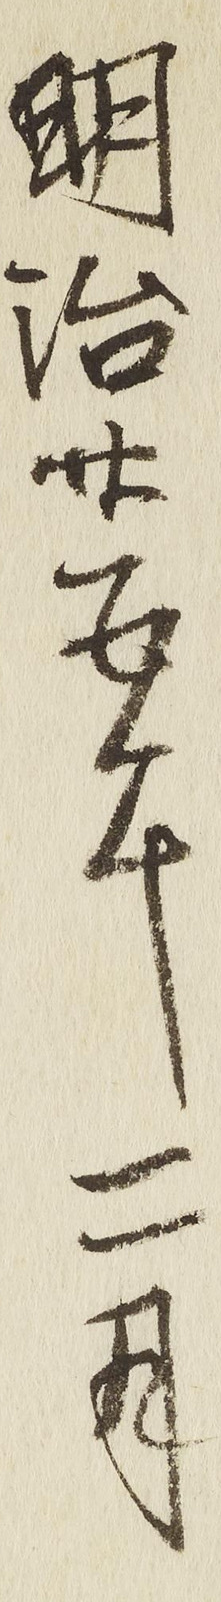明治廿五年二月

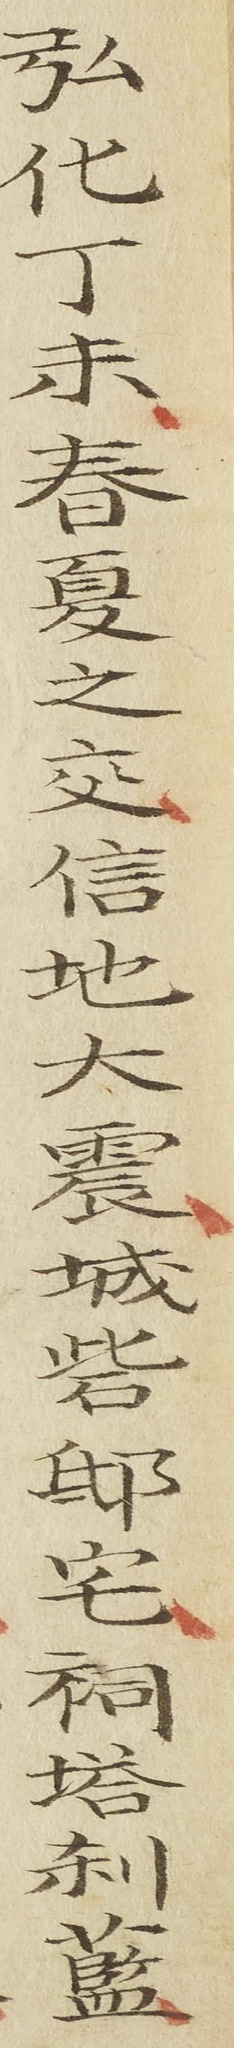弘化丁未春夏之交信地大震城砦邸宅祠搭刹藍
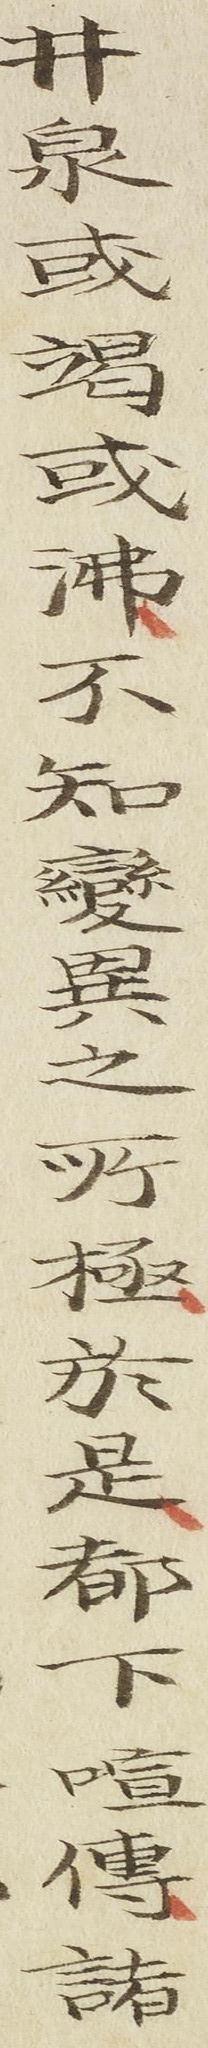井泉或竭或沸不知変異之所極於是都下喧伝諸
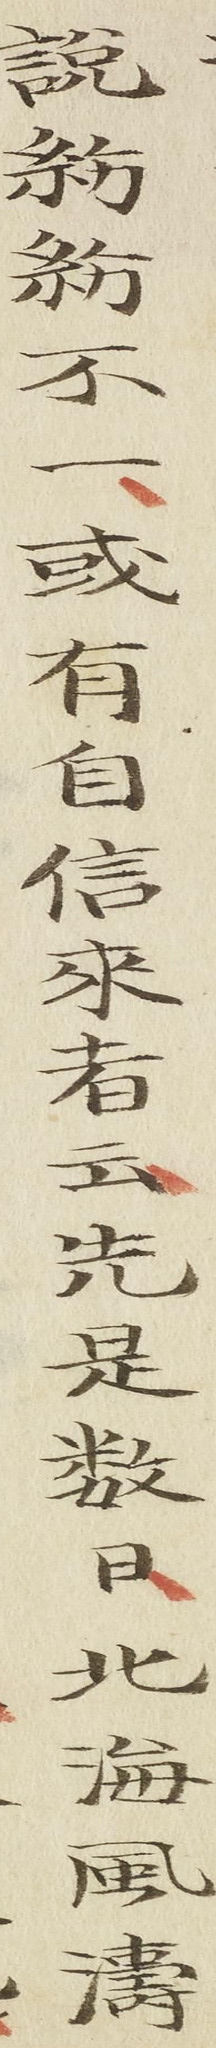説紡紡不一或有自信来者云先是数日北海風濤
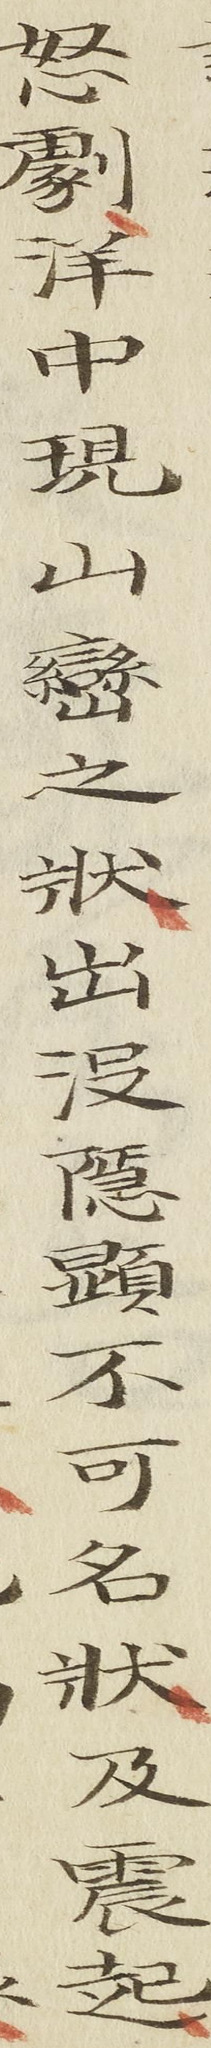怒劇洋中現山密之状出没隠顕不可名状及震起
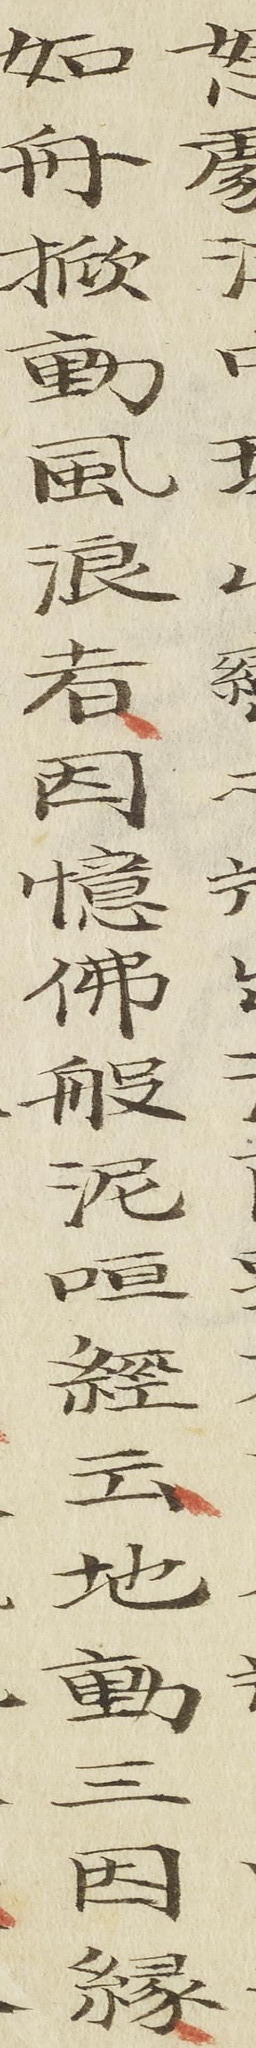如舟掀動風浪者因憶仏般泥咺経云地動三因縁
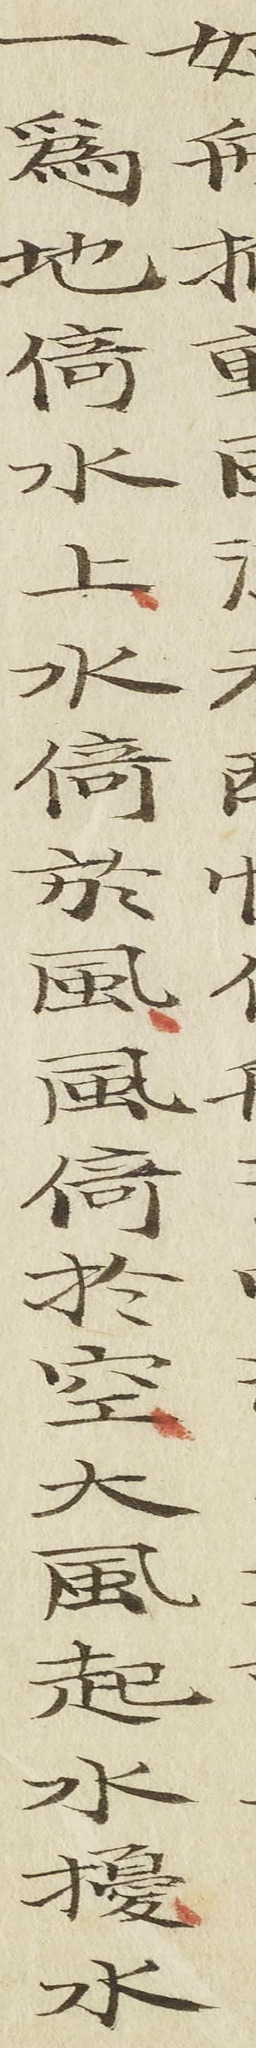一為地倚水上水倚於風風倚於空大風起水擾水
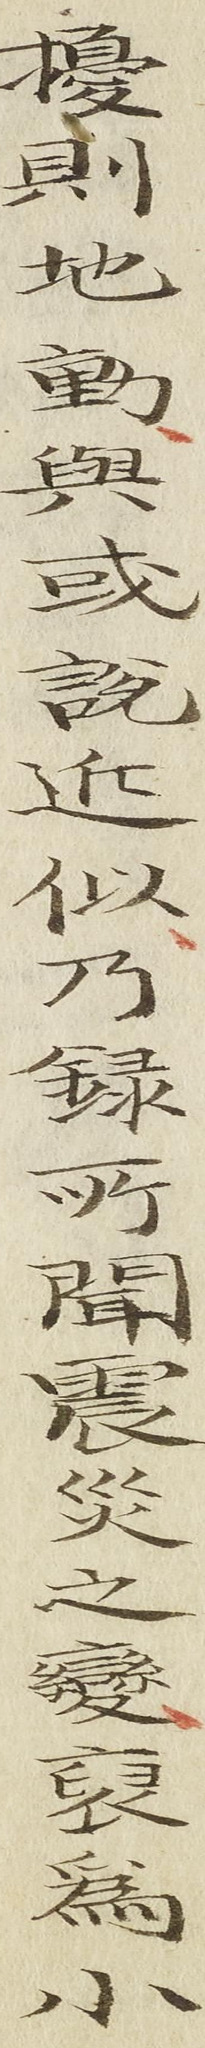擾則地動与或説近似乃録所聞震災之変裒為小
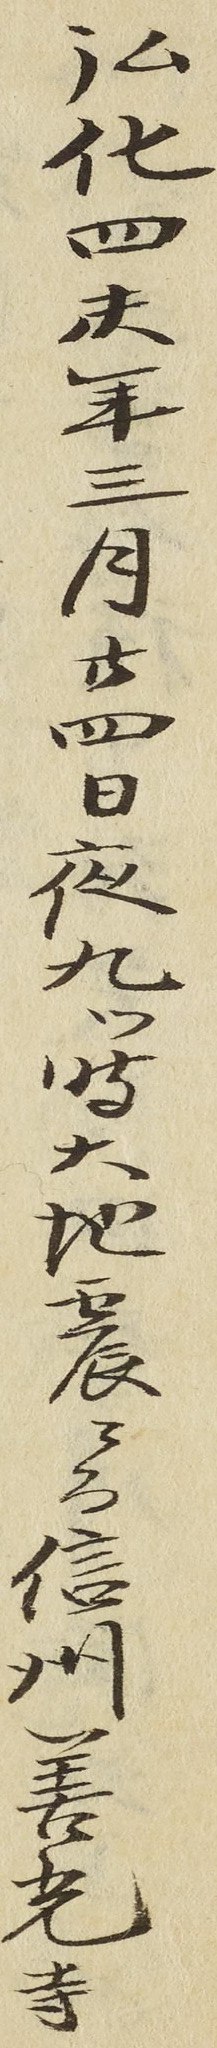弘化四未年三月廿四日夜九ッ時大地震二而信州善光寺
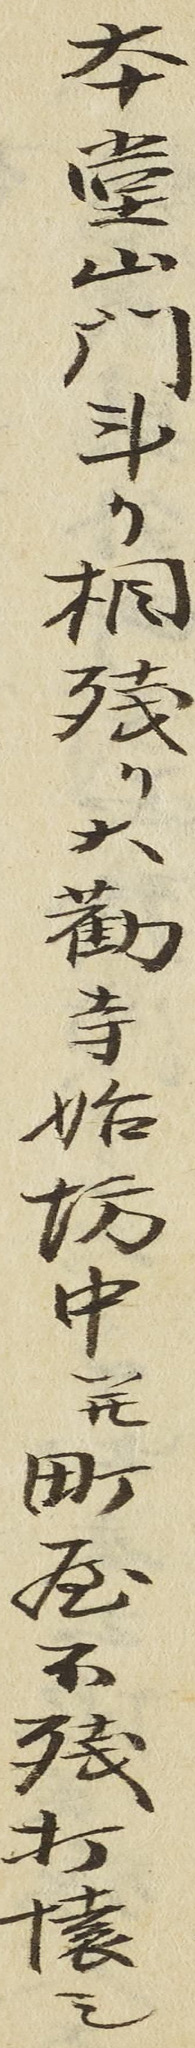本堂山門斗り相残り大勧寺始坊中并町屋不残打壊ㇱ
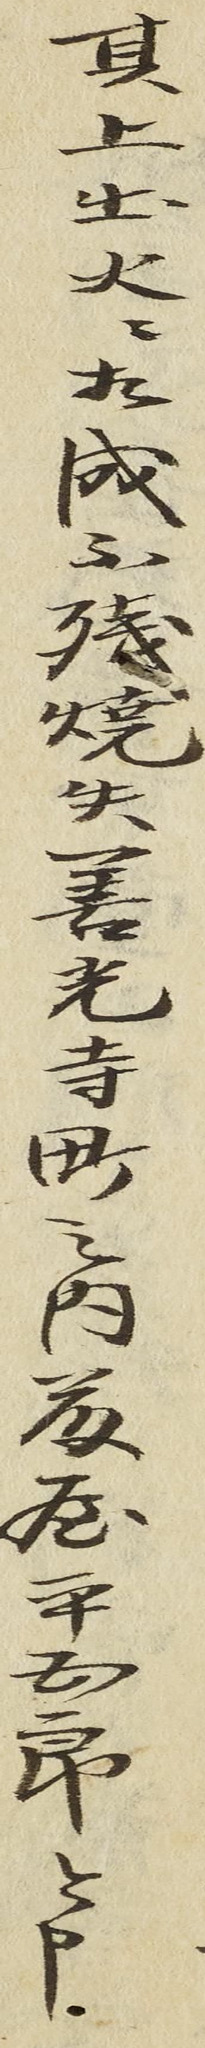其上出火二相成不残焼失善光寺町之内藤屋平五郎と申
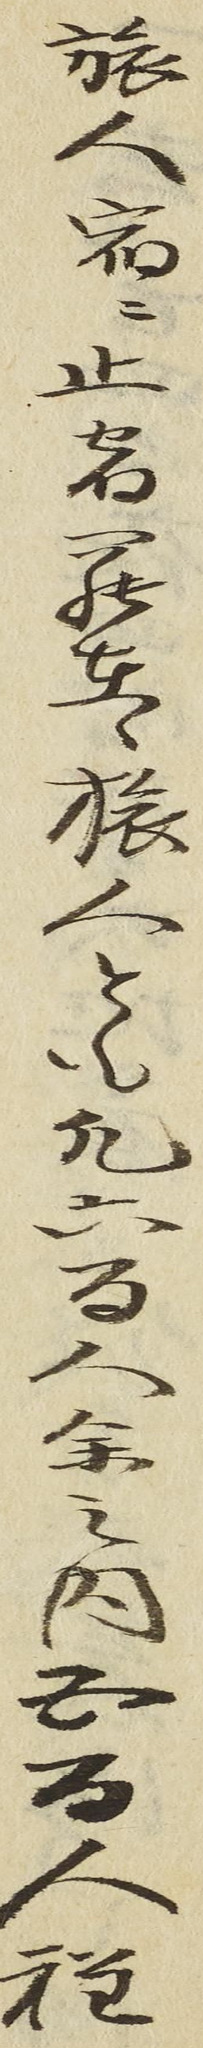旅人宿二止宿罷在候旅人とも凡六百人余之内五百人程
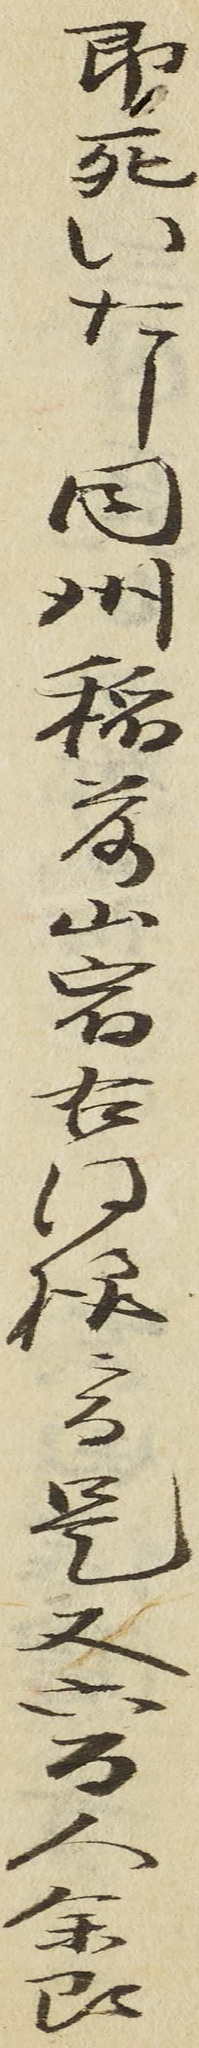即死いたし同州稲荷山宿右同様二而是又六百人余即
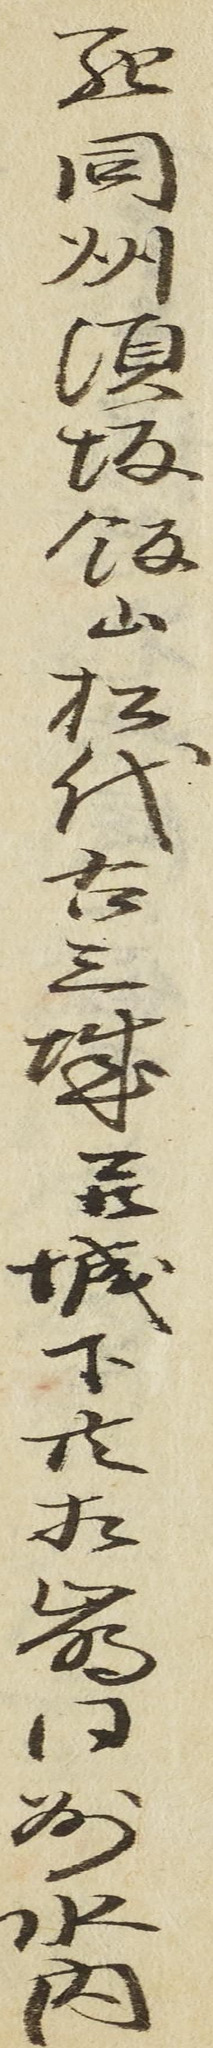死同州須坂飯山松代右三城并城下共相崩同州水内
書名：信濃國大地震記　乾
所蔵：東京大学地震研究所図書室 Earthquake Research Institute Library, The University of Tokyo, JAPAN
